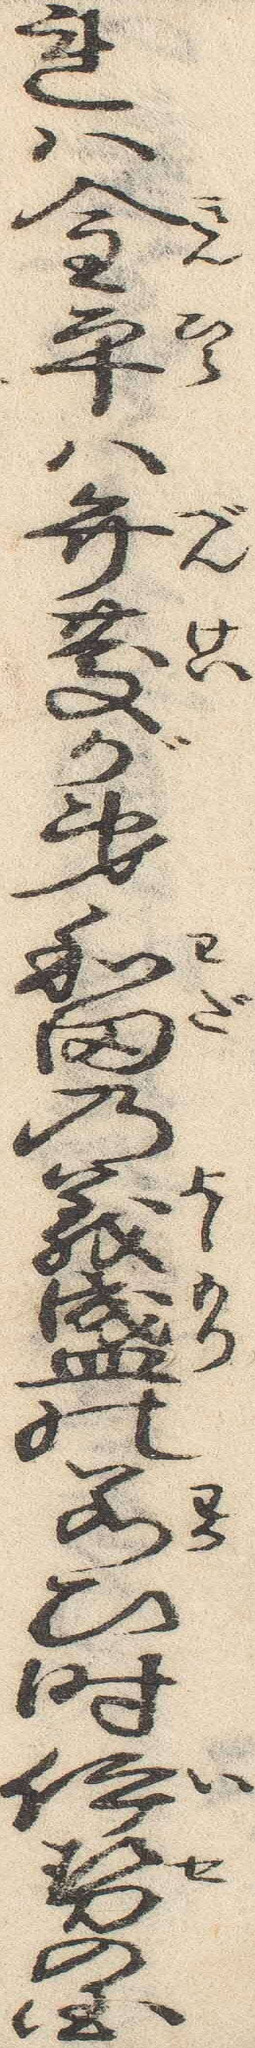れは金平は弁慶が弟和田の義盛の若ひ時伊勢の国
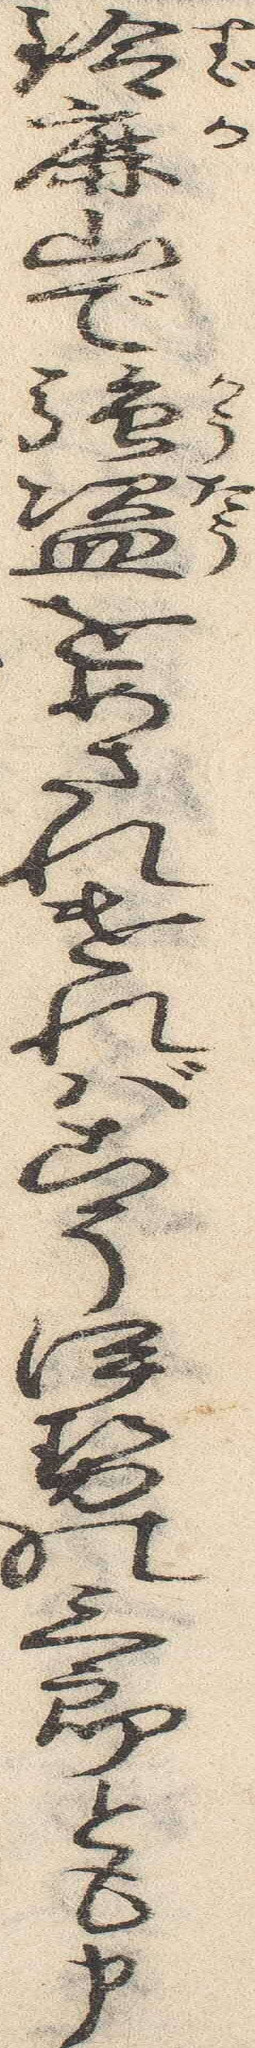鈴鹿山で強盗をめされければこそ伊勢の三郎とも申
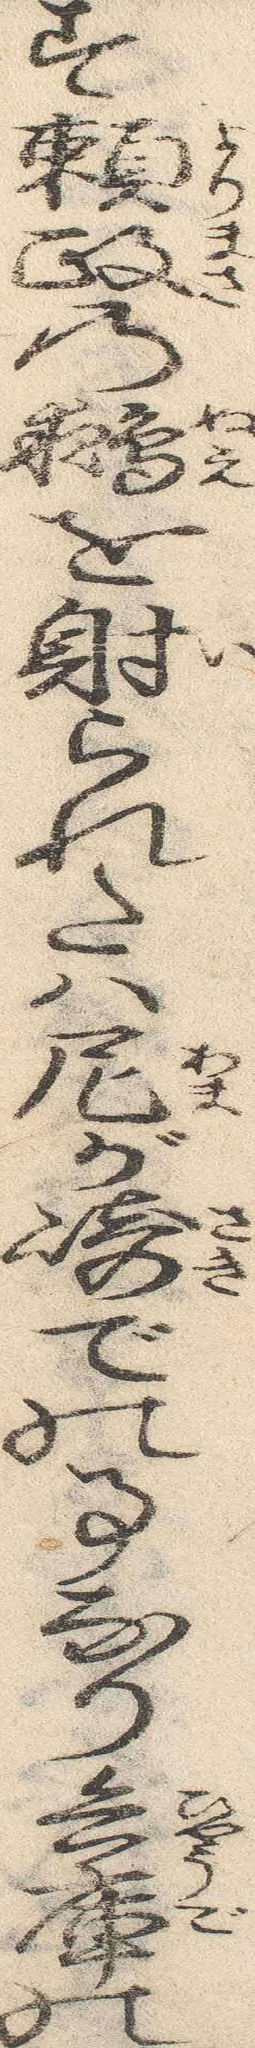す頼政の鵺を射られたは尼が崎での事なり兵庫の
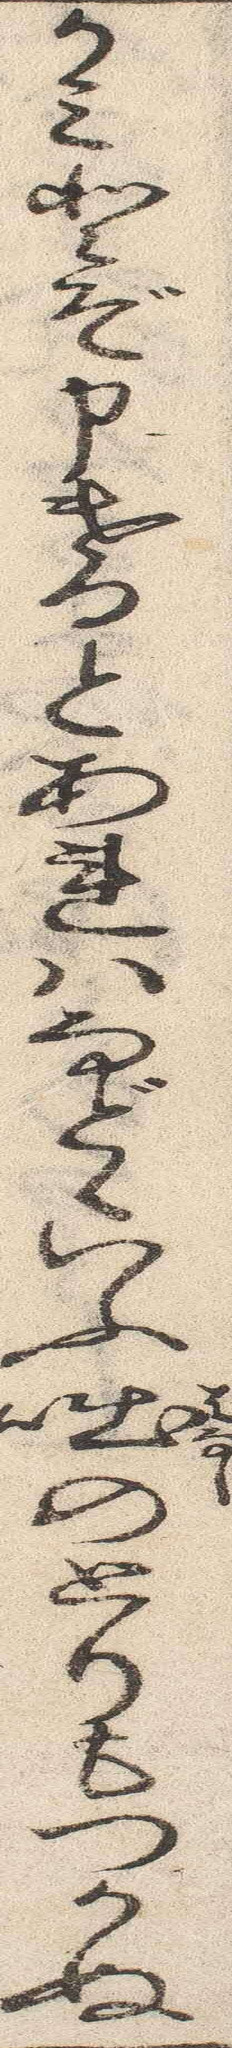かみとぞ申けるとあれはなどゝいふ咄のとりもつかぬ
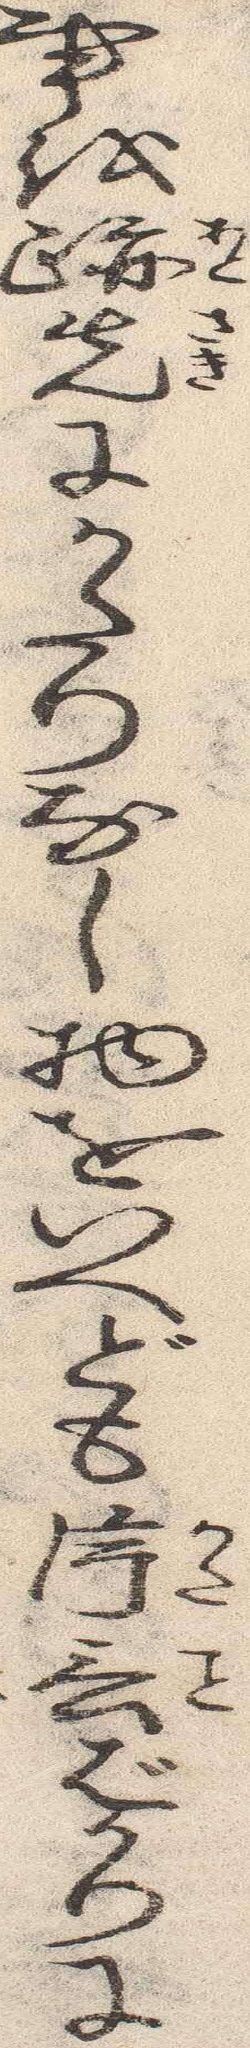事を跡先にかたりなし物をいへども片言ばかりに
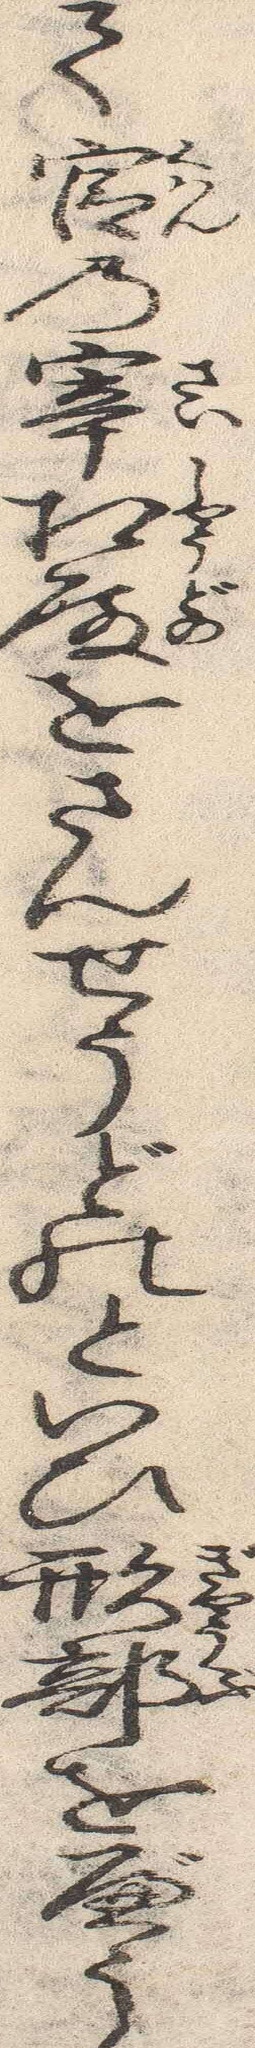て官の宰相殿をさんせうどのといひ形部をべう
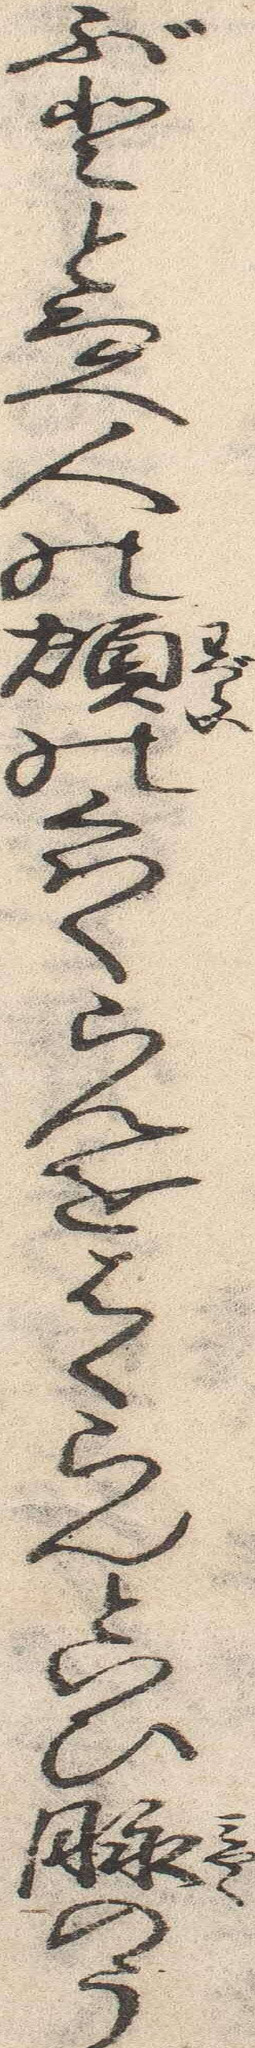ぶととなへ人の煩のくはくらんをはくらんといひ脈のう
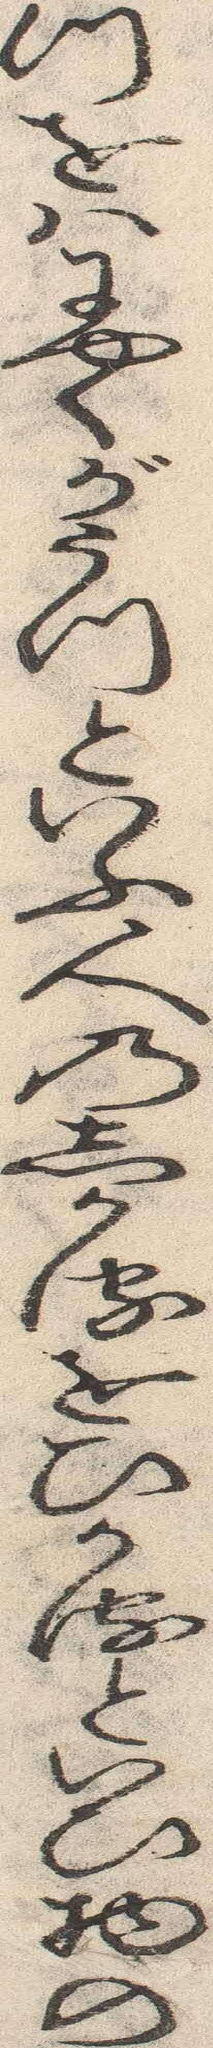つをはにやくがうつといふ人のしかるをひかるといひ物の
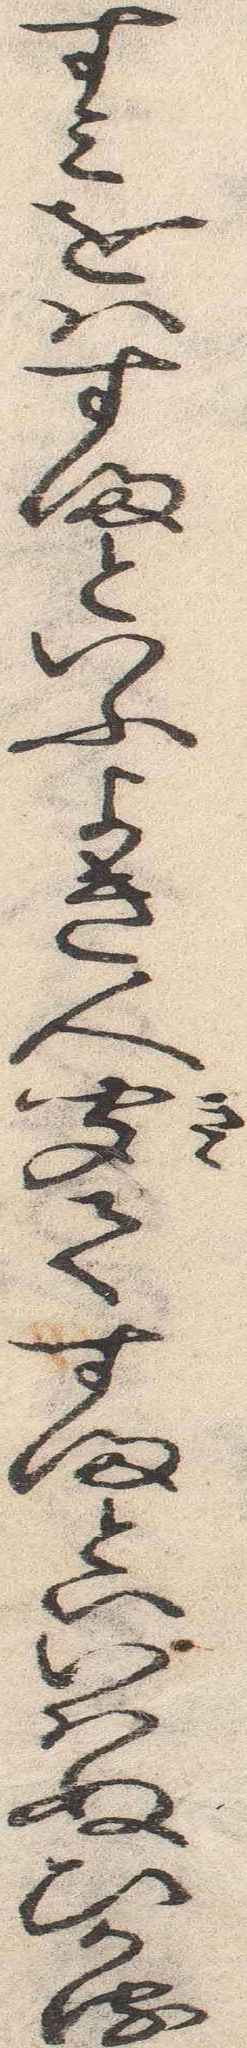すみをはすまといふよき人聞てすまとはいはぬひかる
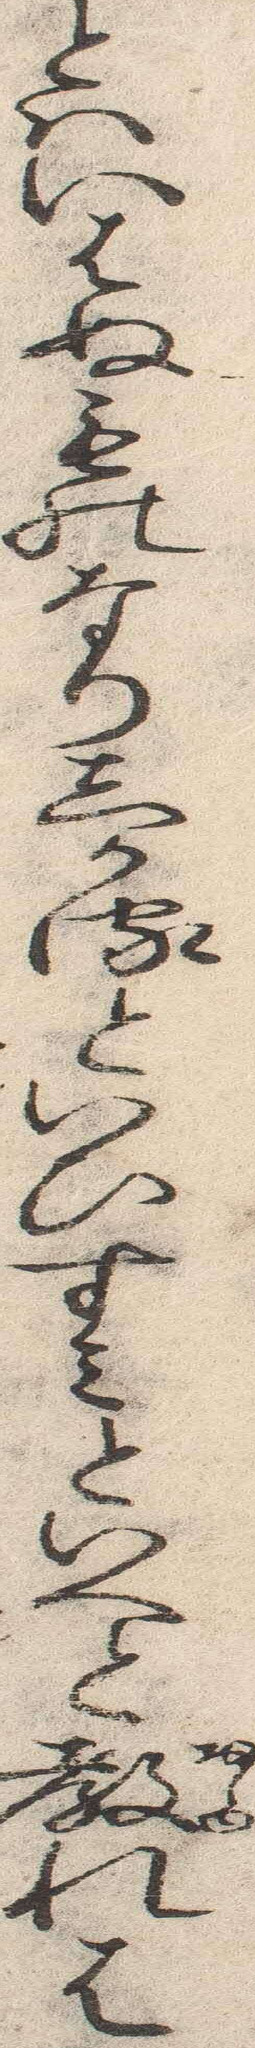とはいはぬものなりしかるといひすみといへと教れは
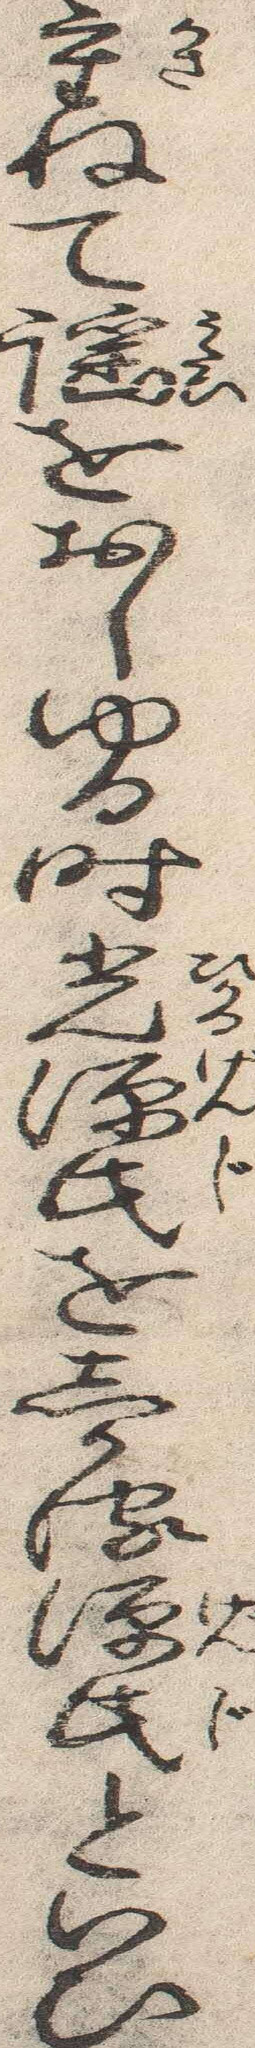重ねて謡をおしゆる時光源氏をしかる源氏といひ
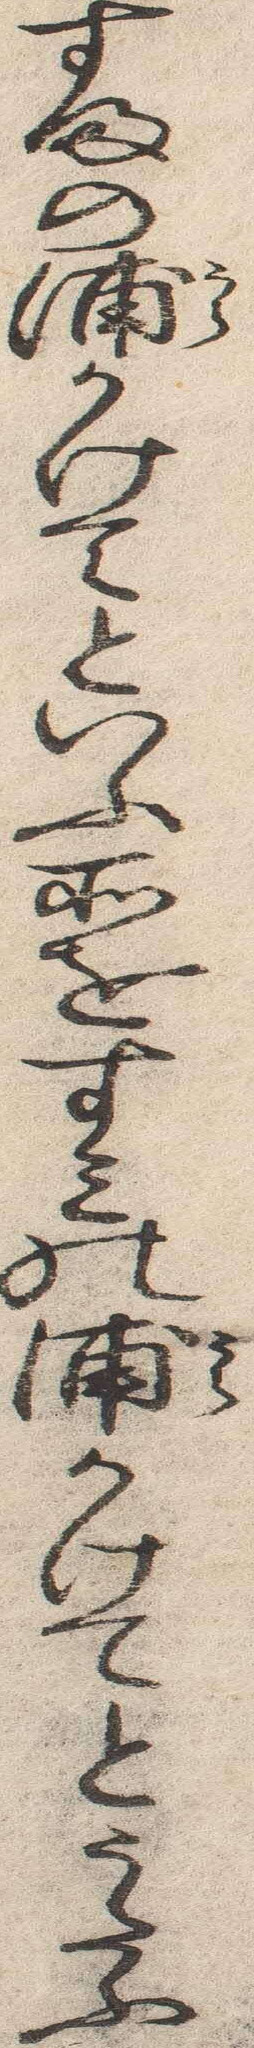すまの浦かけてといふ所をすみの浦かけてとうたふ
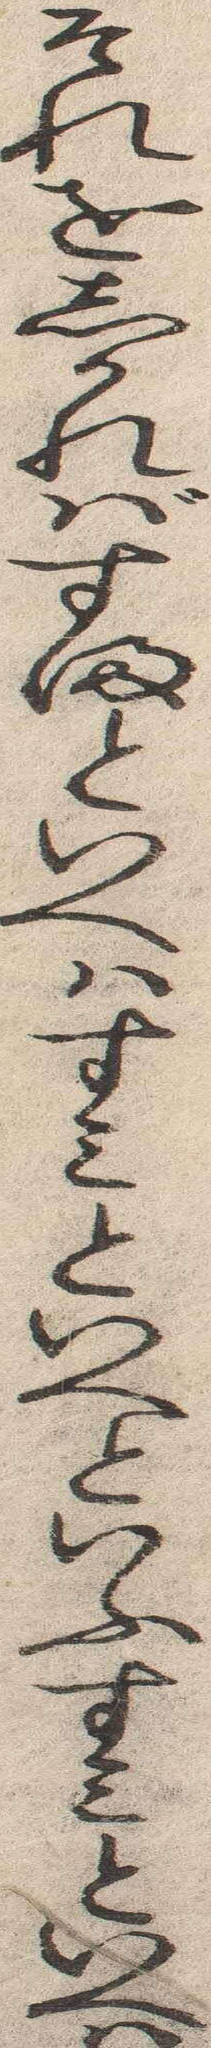それをしかればすまといへはすみといへとすみといへは
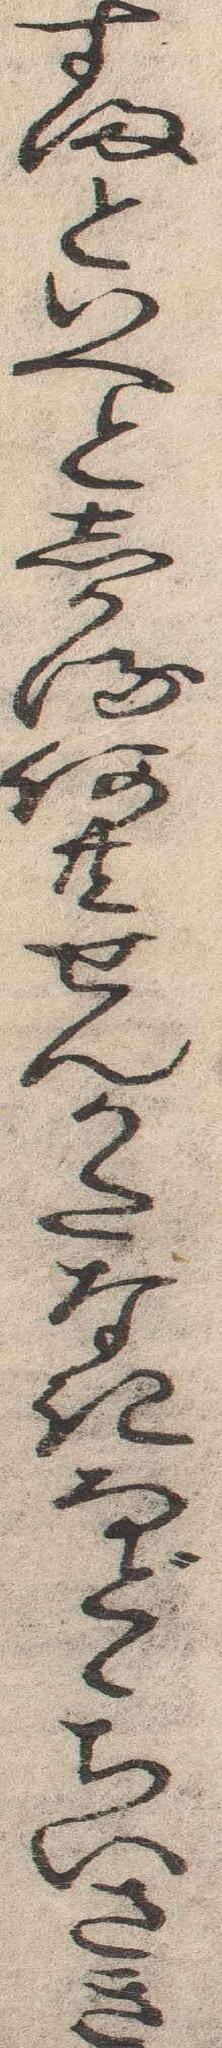すまといへとしかる何共せんかたなきなどゝちいさき

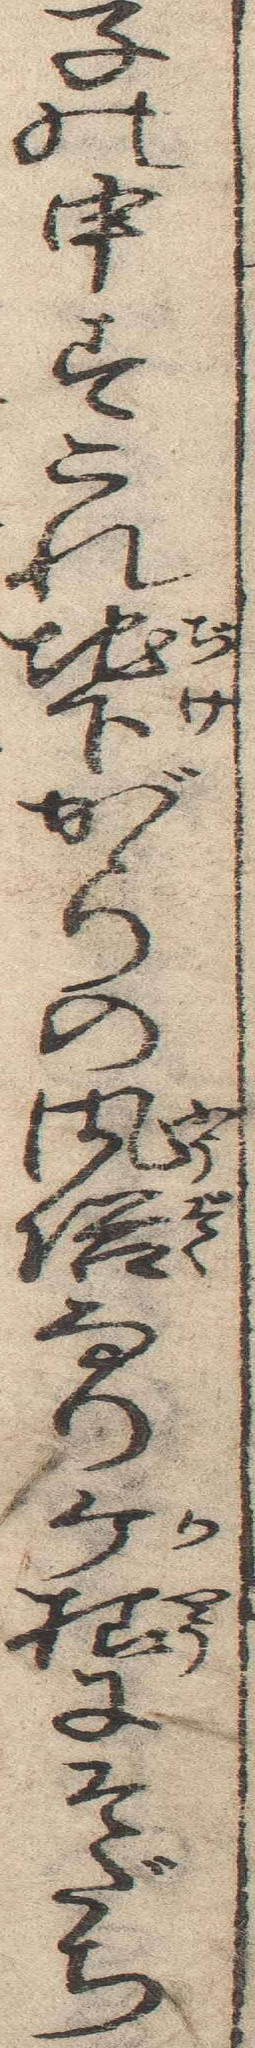子の申すこれ地下がゝりの風俗なりケ様にそだち
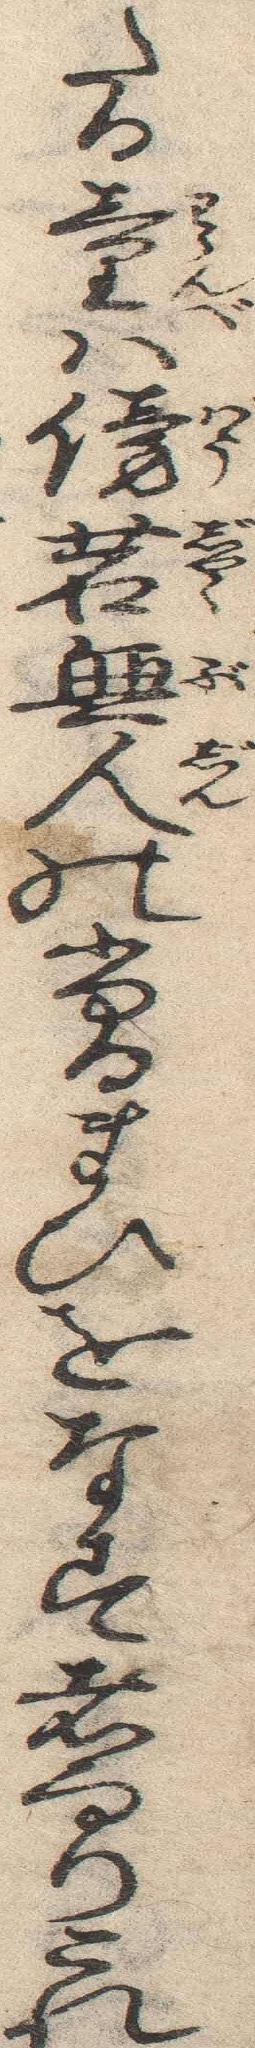たる童は傍若無人のふるまひをなす者なりこれ
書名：小児必用養育草
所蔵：東京学芸大学附属図書館 国文学研究資料館
